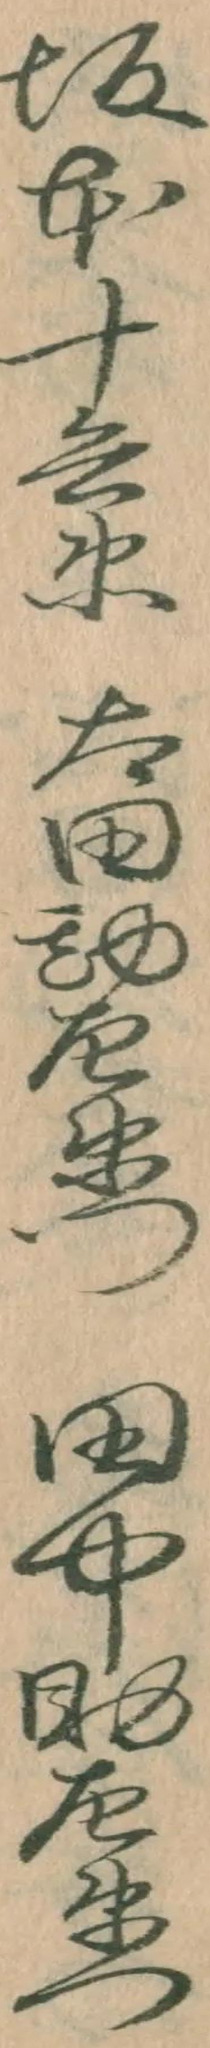坂本十兵衛太田勘左衛門田中助左衛門
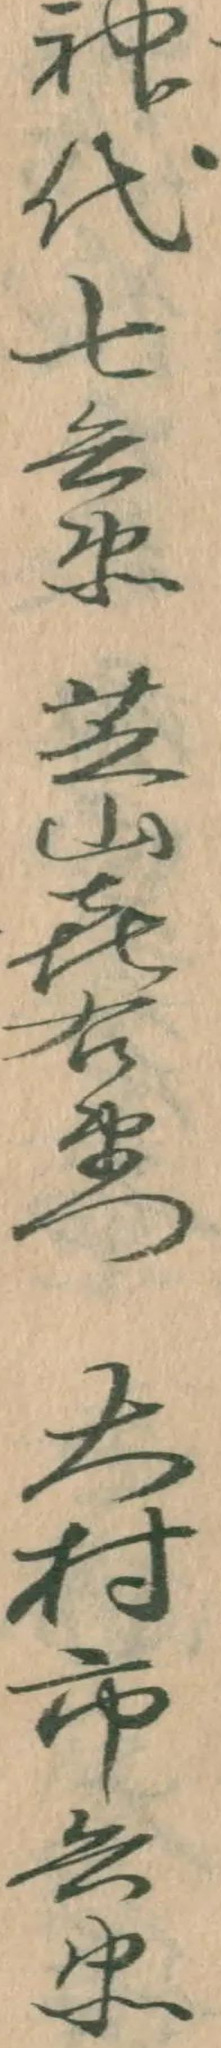神代七兵衛芝山喜右衛門大村市兵衛
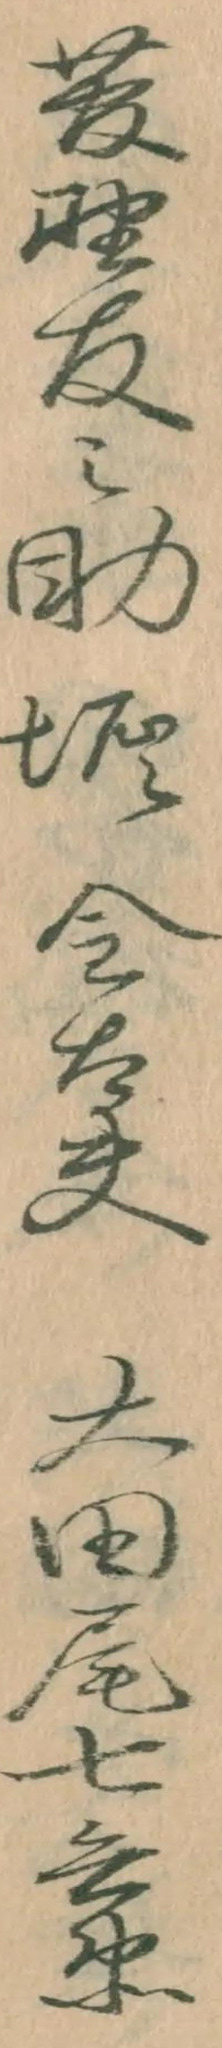菅野友之助堀金太夫太田尾七兵衛

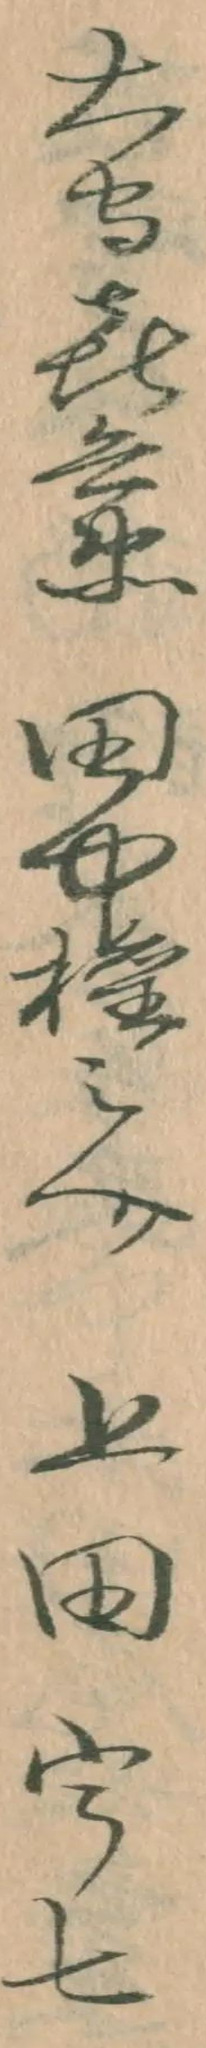大守喜兵衛田中権之介上田宇七
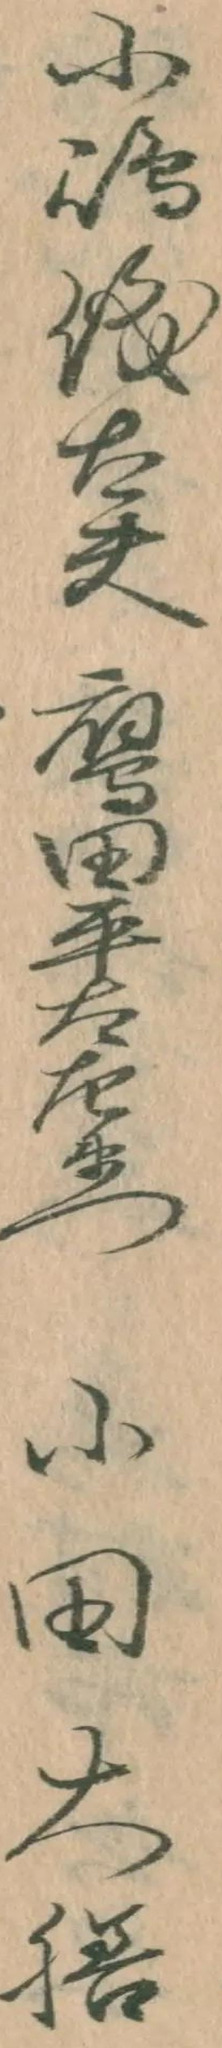小島儀太夫鷹田平太左衛門小田大膳
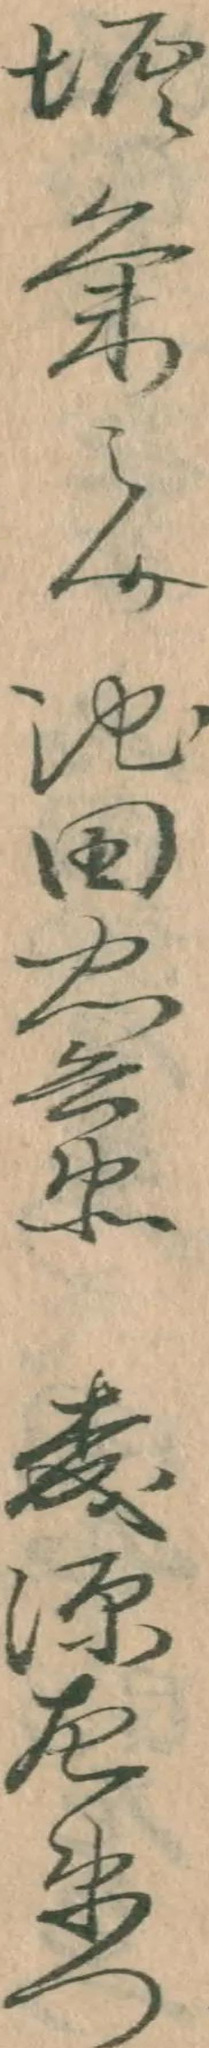堀粂之介池田忠兵衛森源左衛門
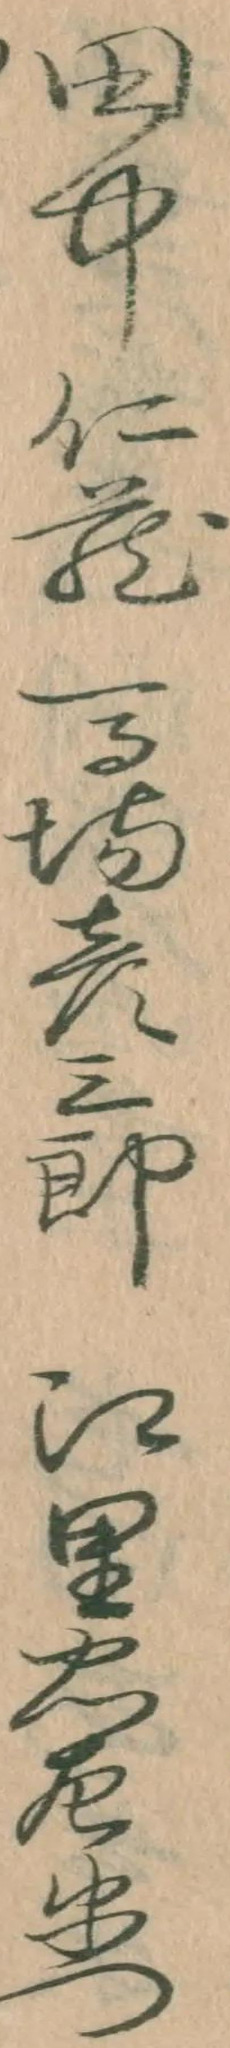田中仁蔵馬場彦三郎江里忠左衛門
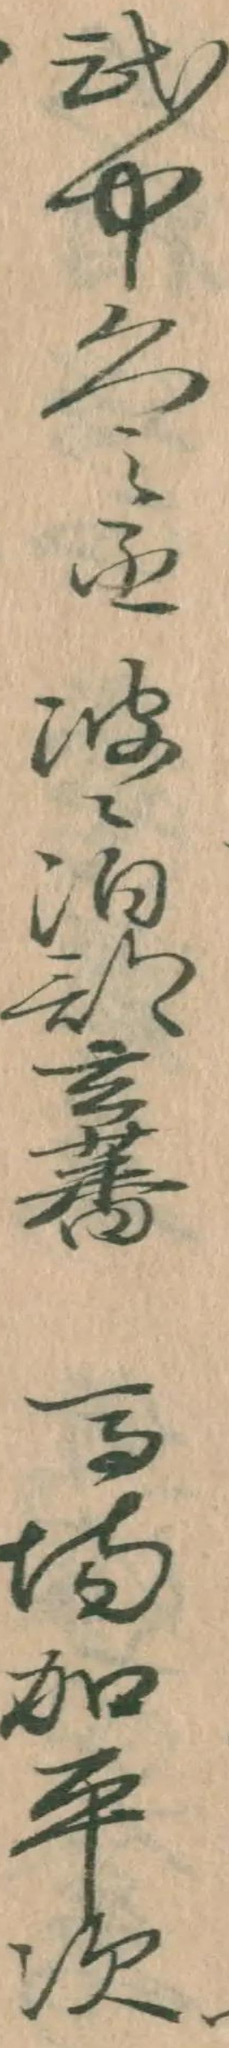武中久之丞波々泊部玄蕃馬場加平次
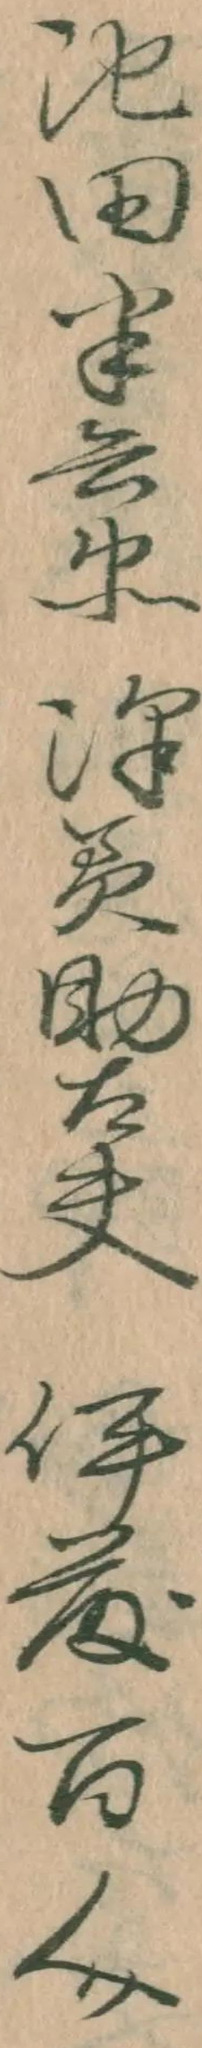池田半兵衛沢美助太夫伊藤百介
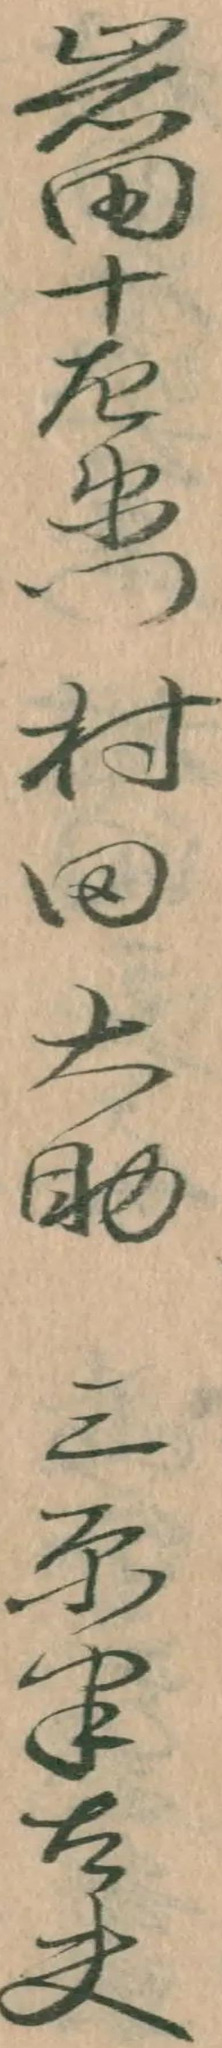岩田十左衛門村田大助三原半太夫
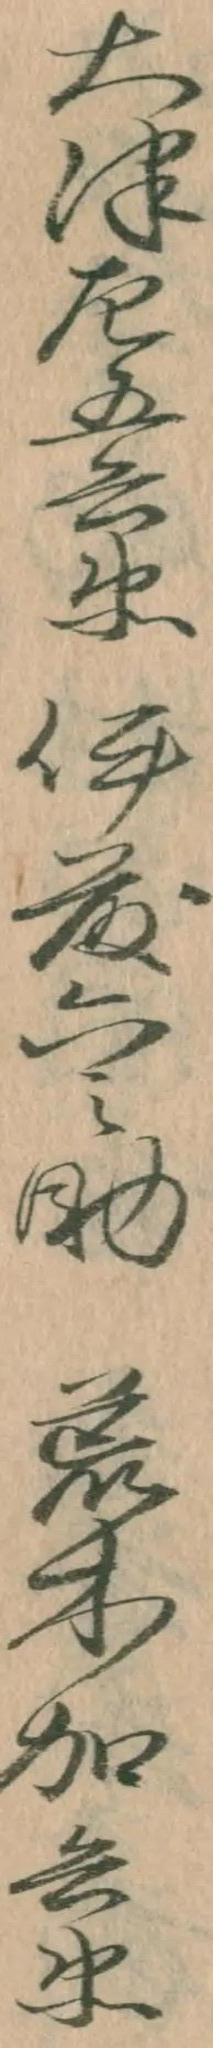大津左五兵衛伊藤六之助荒木加兵衛
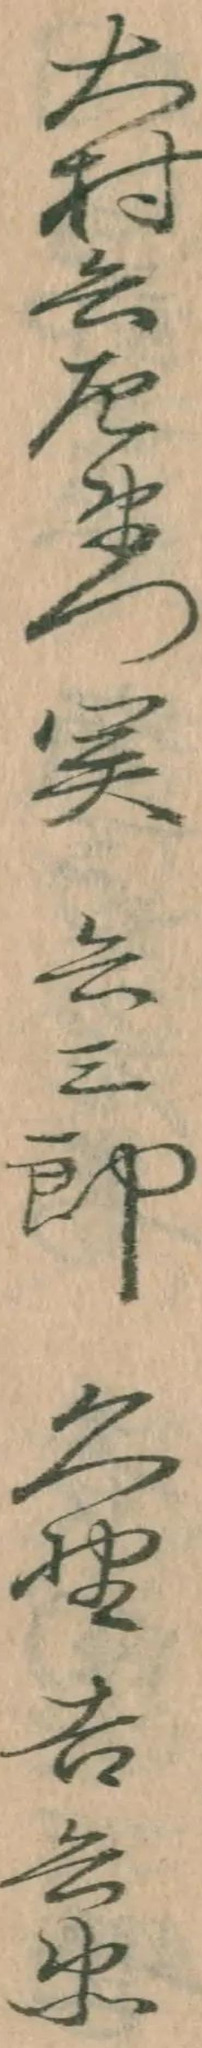大村兵左衛門関兵三郎久里吉兵衛
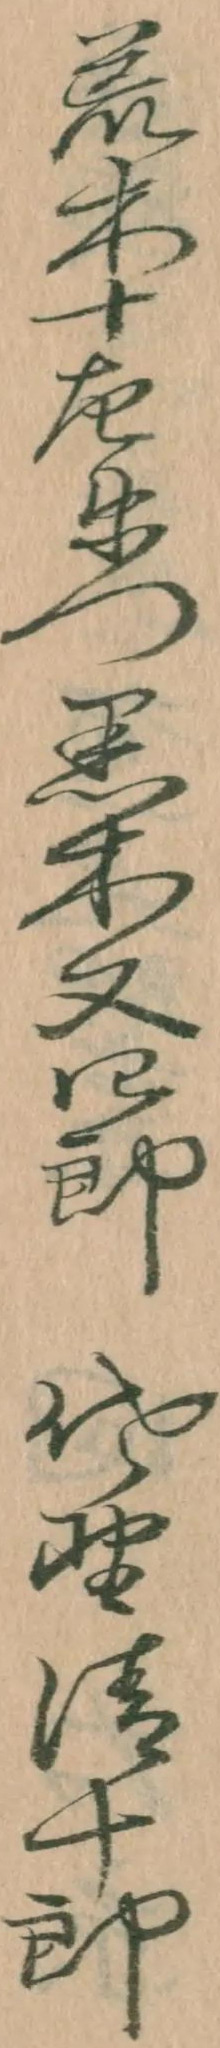荒木十左衛門黒木又四郎佐野清十郎
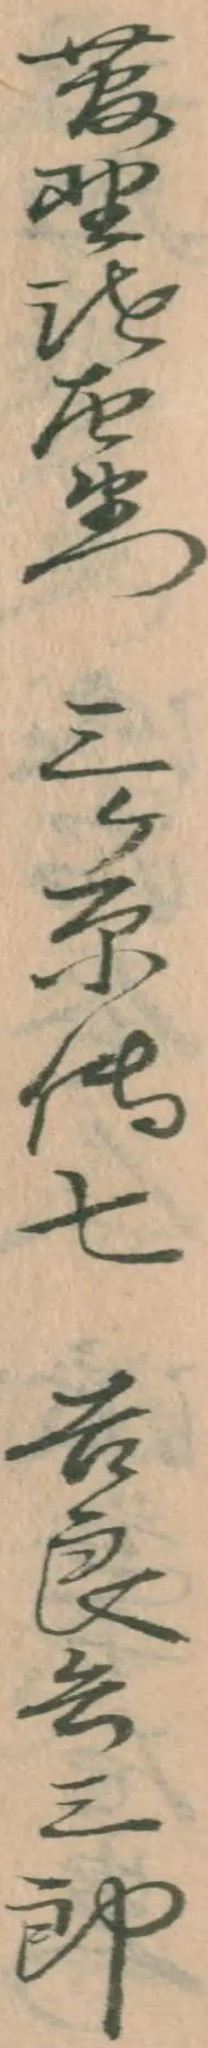菅野諸左衛門三け原伝七吉良兵三郎
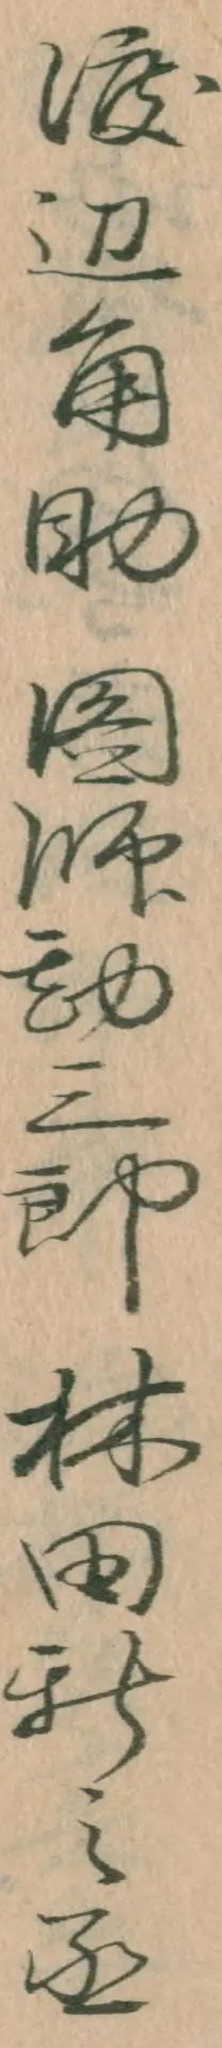渡辺角助閣師勘三郎林田新之丞
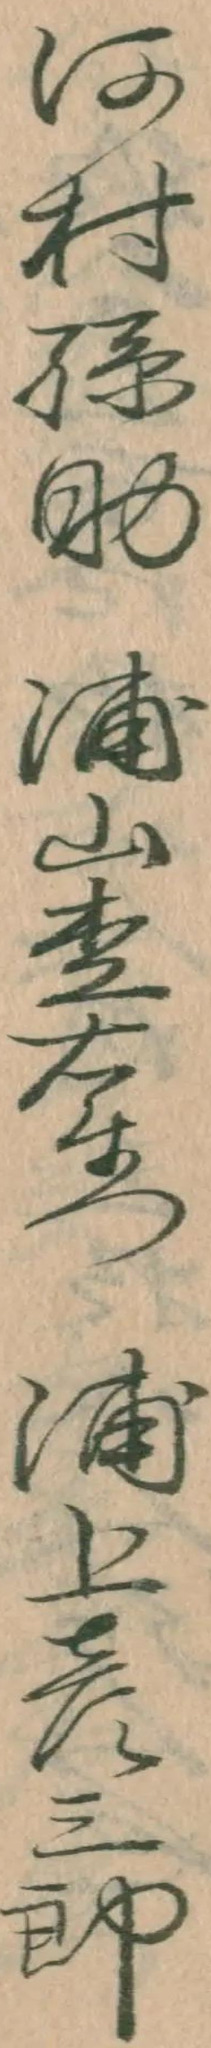河村孫助浦山杢右衛門浦上彦三郎
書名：切支丹御退治記 49巻. [9]
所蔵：国立国会図書館 National Diet Library, JAPAN
